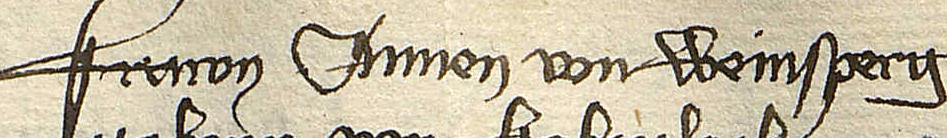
Frawn Annen von Weinſperg
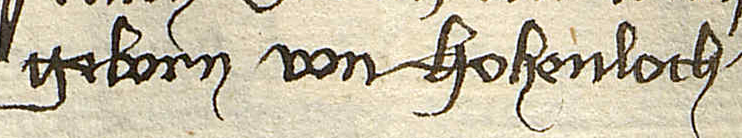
geborn von hohenloch
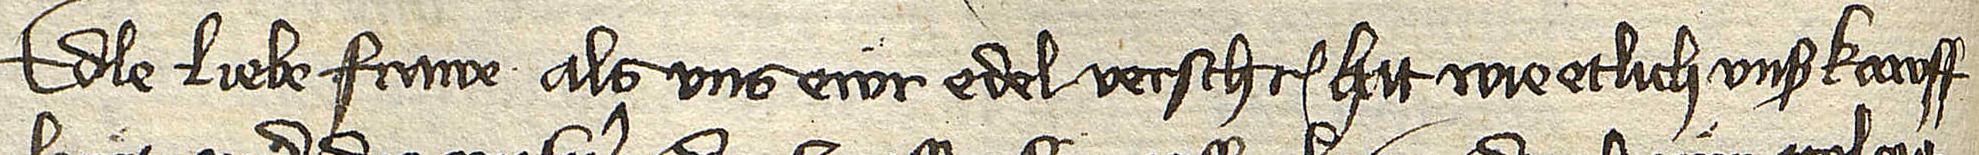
Edle liebe frawe . als vns eẅr edel verſchr* hat wie etlich vnſ* kawff
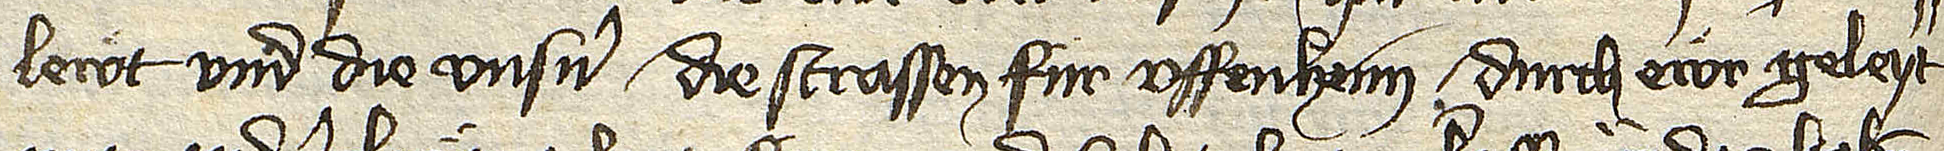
leẅt vnd die vnſn* / die ſtraſſen für vffenheim / durch eẅr geleyt
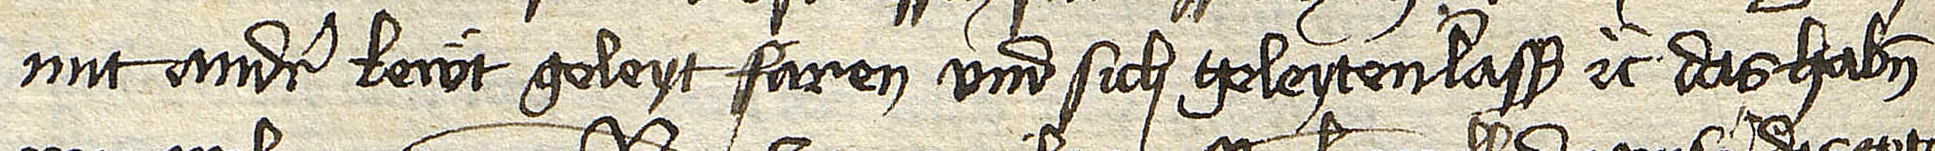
mit andr* leẅt geleyt faren vnd ſich geleyten laſſ* ec* das habn*
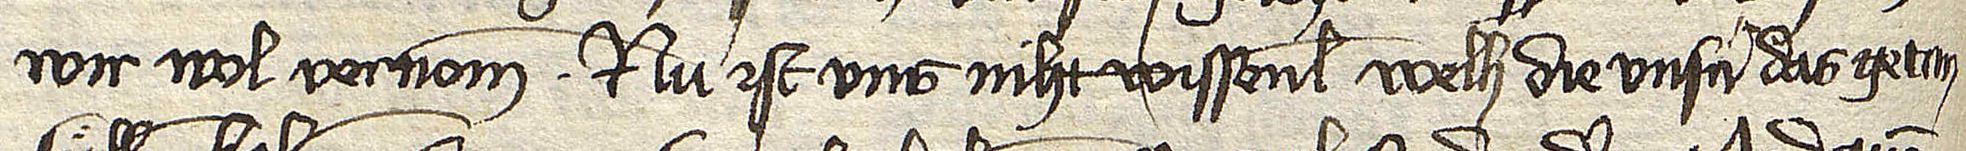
wir wol vernom* . Nu iſt vns niht wiſſenl* welh die vnſn* das getan
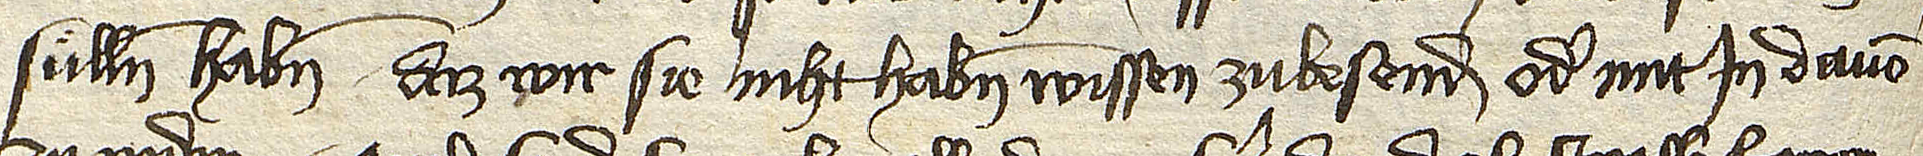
ſülln* habn* / daʒ wir ſie niht habn* wiſſen ʒu beſend* od* mit In dauo*
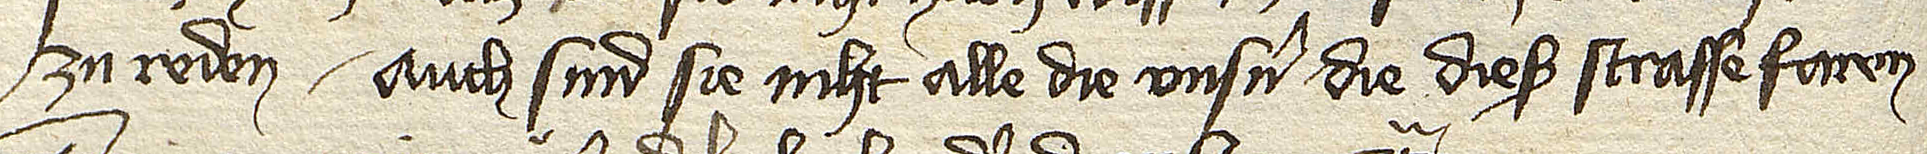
ʒu reden / Auch ſind ſie niht alle die vnſn* / die dieſ* ſtraſſe faren
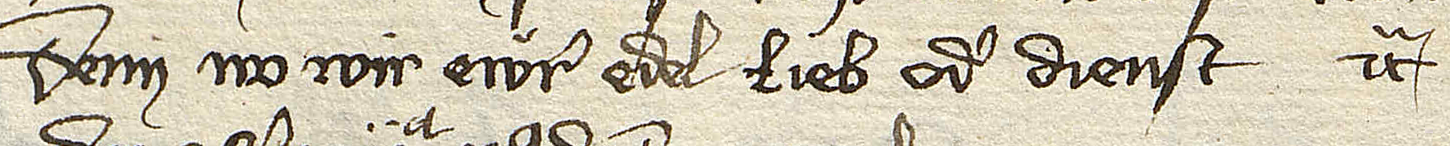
Denn wo wir eẅr* edel lieb od* dienſt ec*
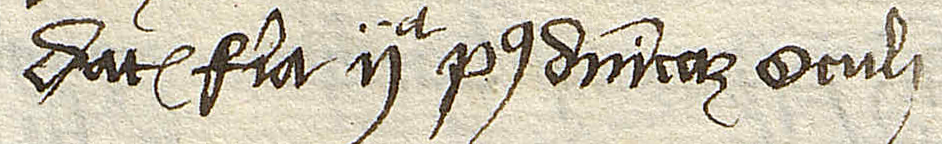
Dat* fi*a ii* p* dni*ca* Oculi
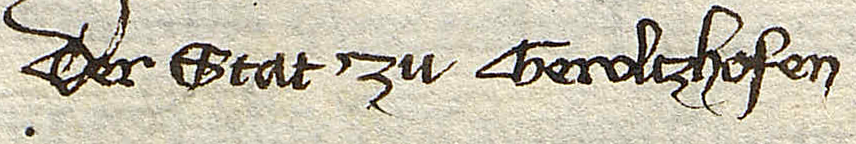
Der Stat ʒu Gerolcʒhofen
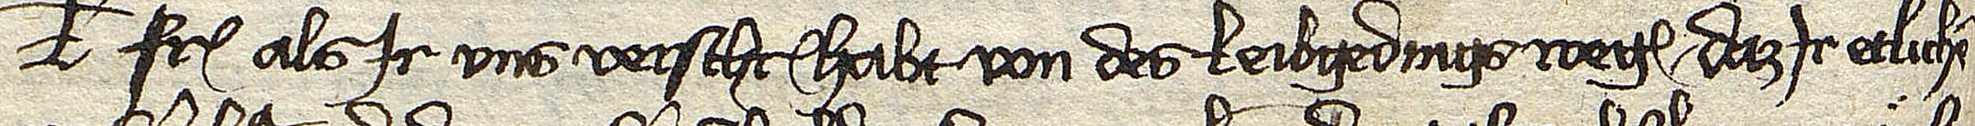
L* fr* als Ir vns verſchr* habt von des leibgedings weg* / daʒ Ir etliche*
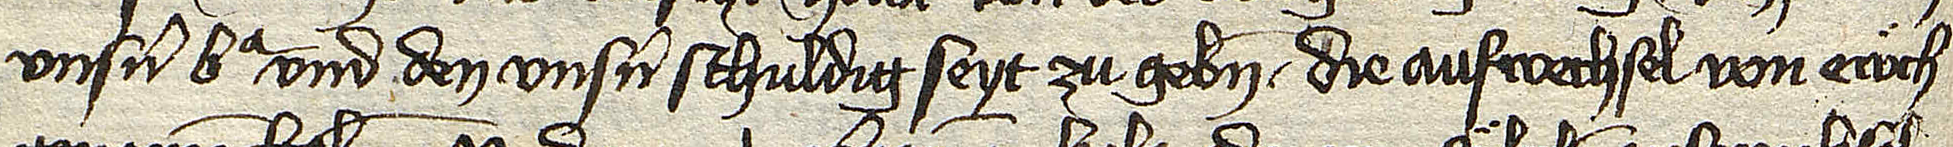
vnſn* b* / vnd den vnſn* ſchuldig ſeyt ʒu gebn* / die aufwechſel von eẅch
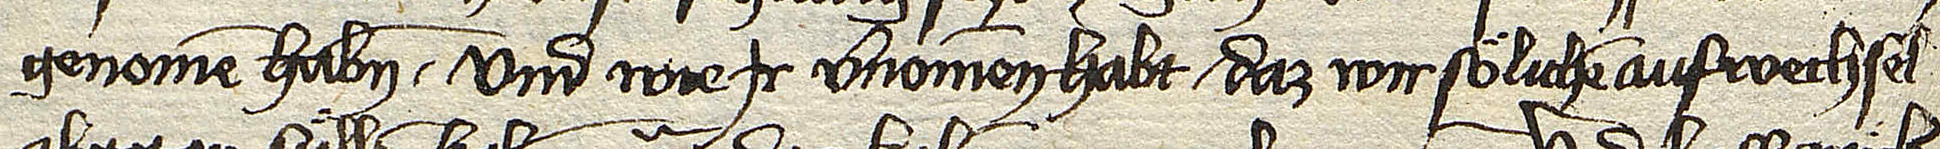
genome* habn* / vnd wie Ir v*nom*en habt / daʒ wir ſöliche* aufwechſel
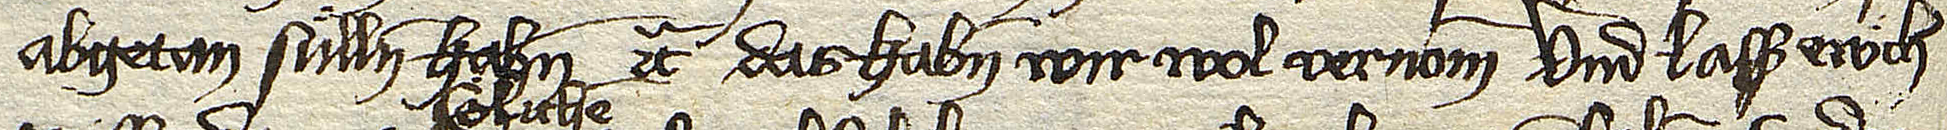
abgetan ſülln* habn* ec* / das habn* wir wol vernom* Vnd laſſ* eẅch
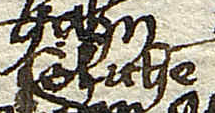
ſöliche*
